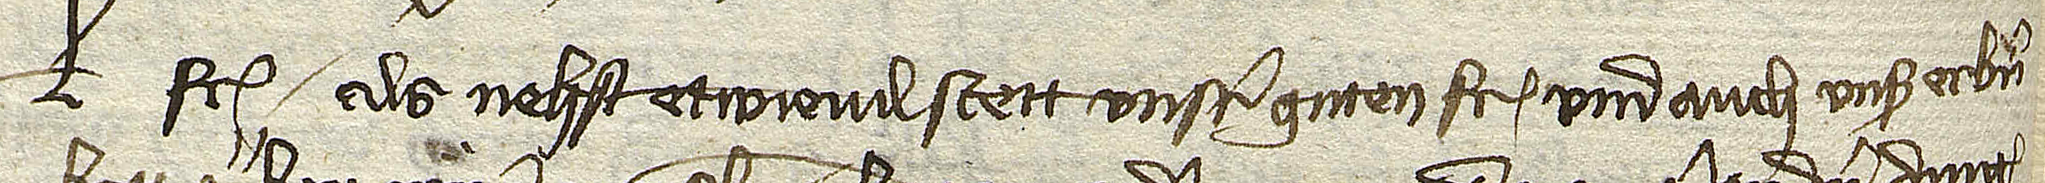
L* fr* / als nehſt etwieuil ſtett vnſ*r guten fr* vnd auch vnſ* erb*n
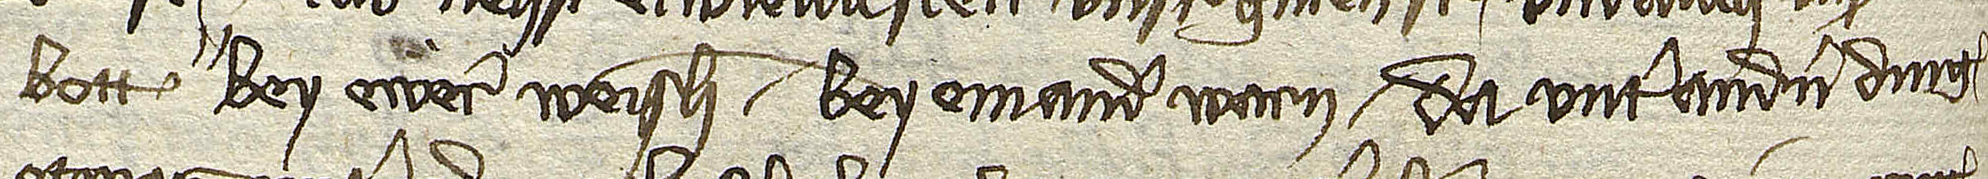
bott* bey eẅer* weiſh* / bey einand* warn / Da vnt* and*n ding*
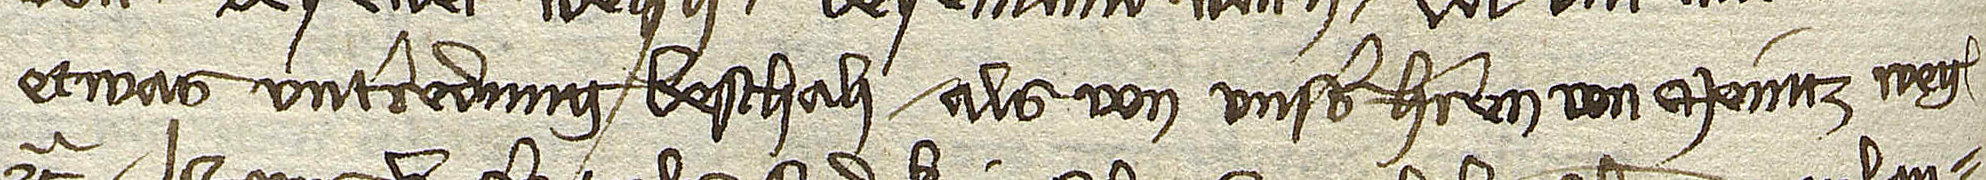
etwas vnt*redung beſchah / als von vnſ*s h*ren von Meincʒ weg*
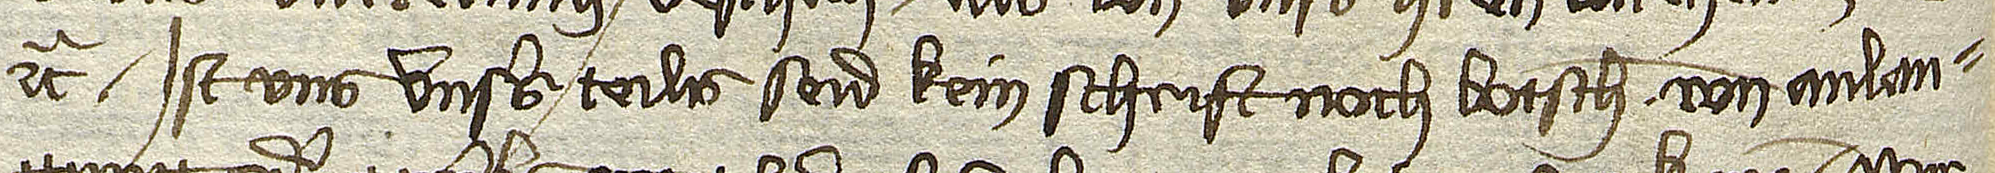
ec* / Iſt vns Vnſ*s teils ſeid kein ſchrift noch botſch* von anlan =
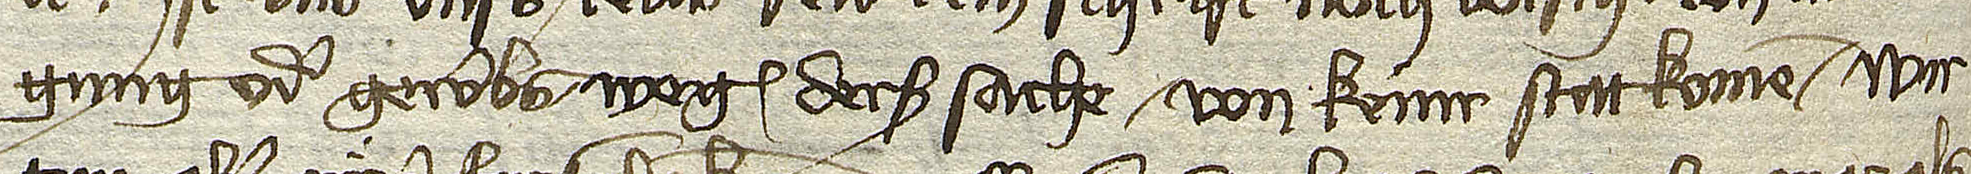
gung od* gew*bs / weg* derſ* ſache / von keinr ſtatt kome* / Wir
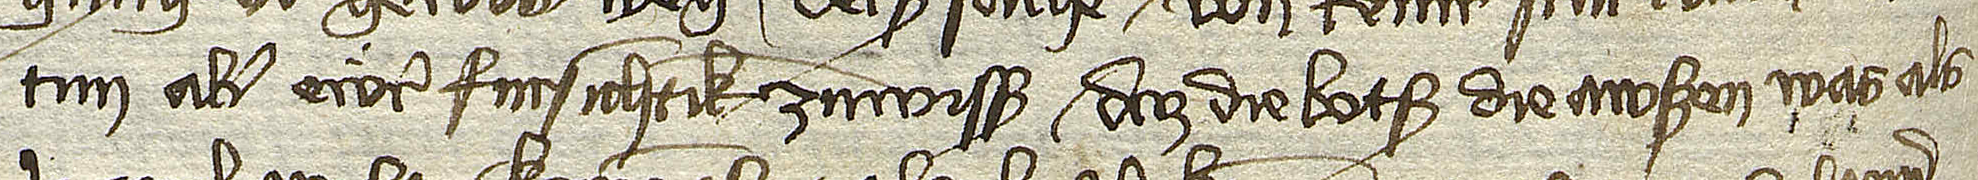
tun ab* eẅr furſichtik* ʒuwiſſ* / Daʒ die botſ* die awſ*en was als
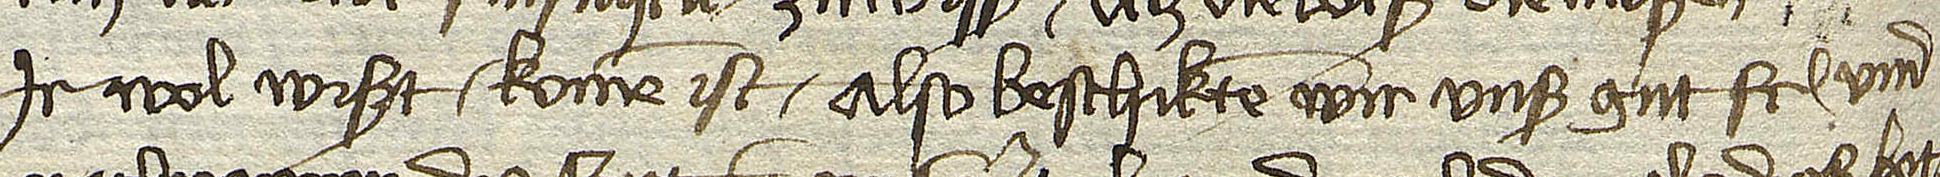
Ir wol wiſ*t / kome* iſt / alſo beſchikte* wir vnſ* gut fr* vnd
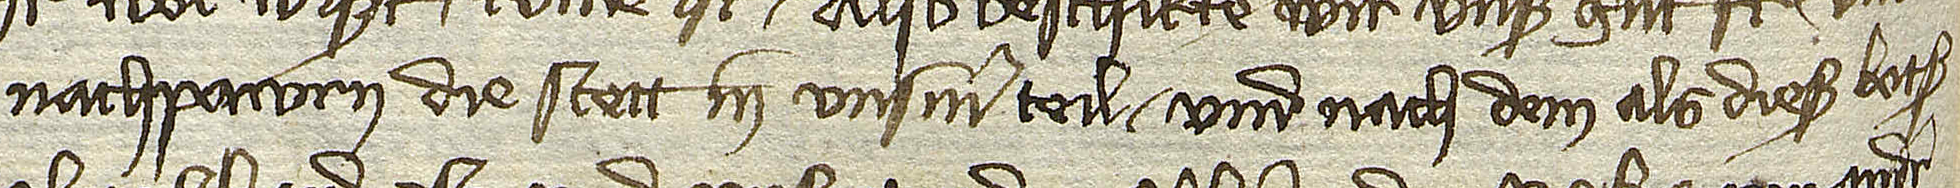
nachpawrn die ſtett in vnſ*m teil / vnd nach dem als dieſ* botſ*
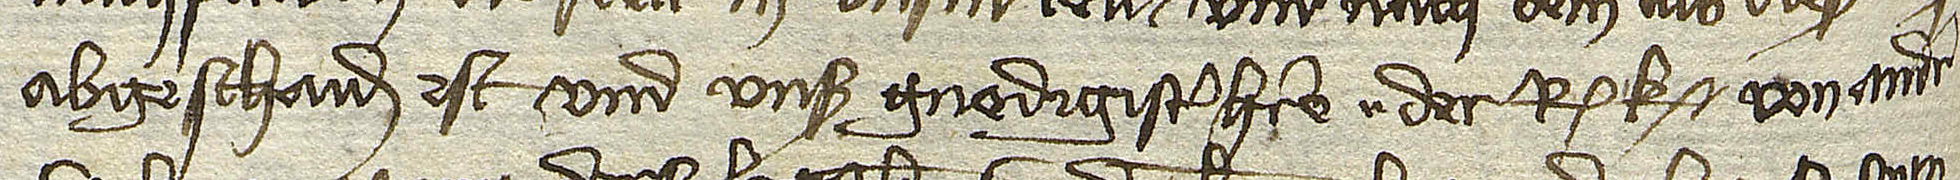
abgeſchaid* iſt vnd vnſ* gendigiſt* h*re ~ der R* K* von and*r
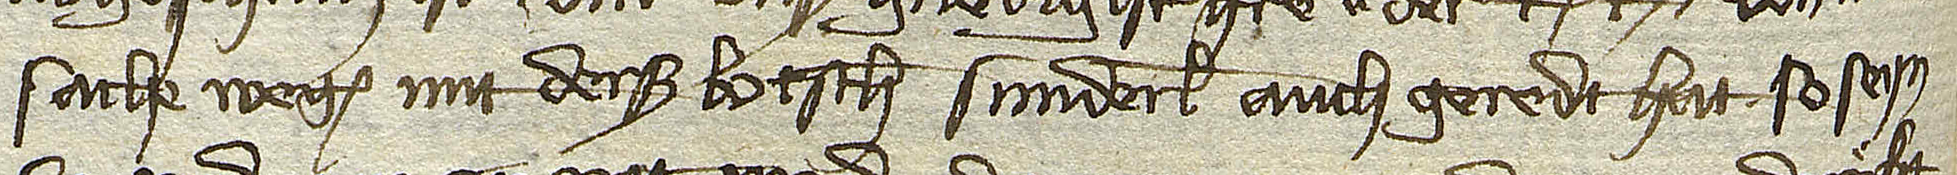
ſache weg* mit derſ* botſch* ſunderl* auch geredt hat . ſo ſeyn
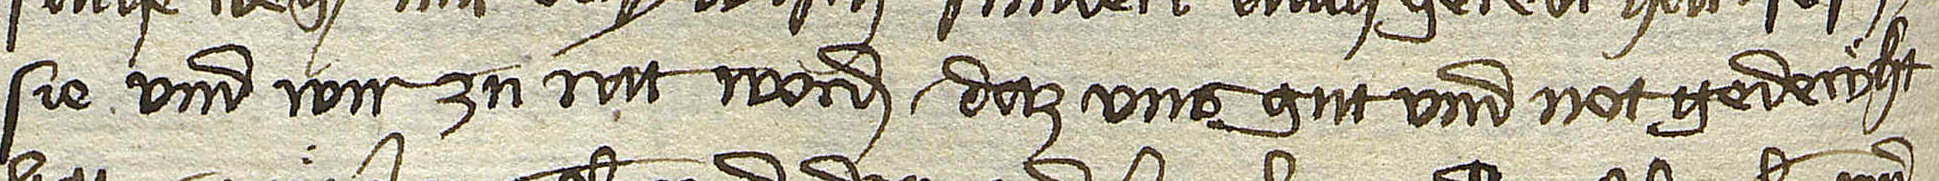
ſie vnd wir ʒu rat word* / daʒ vns gut vnd not gedeẅht
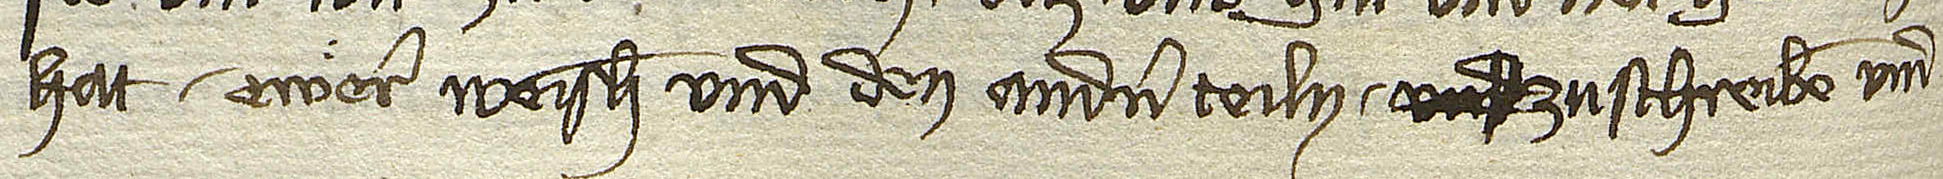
hat / eẅer* weiſh* vnd den and*n teiln / vnſ* ʒu ſchreibe* vnd
